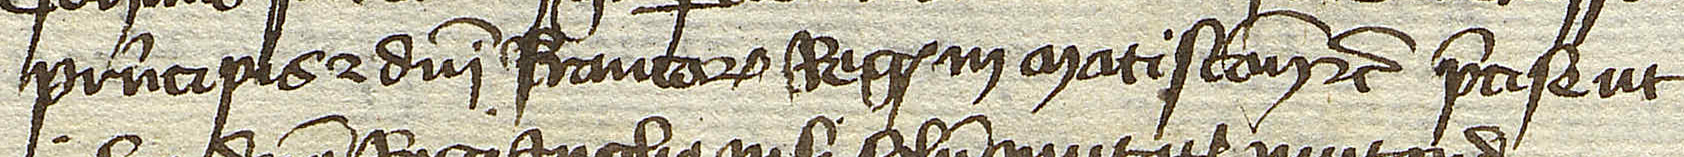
pr*ncipis @ d*ni Franco* Reg* in Matiſcon* ec* P*ciſe ut
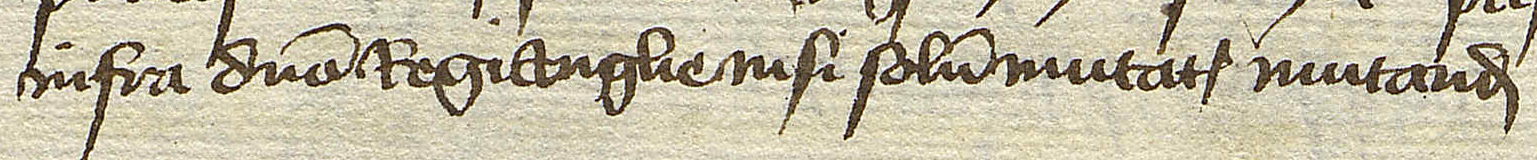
infra d*no Regi Anglie niſi ſolu* mutat* mutand*
